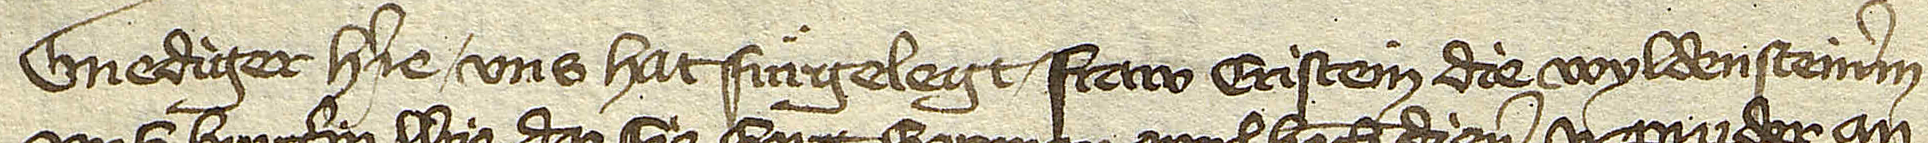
Gnediger h*re / vns hat fürgelegt / fraw Criſtein die wyldenſtein*in
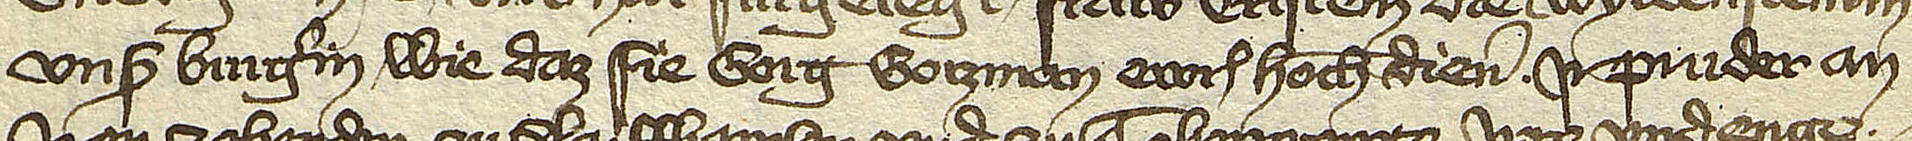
vnſ* burg*in / wie daʒ ſie Gorg Gocʒman ewr* hoch* dien* . Ir pruder an
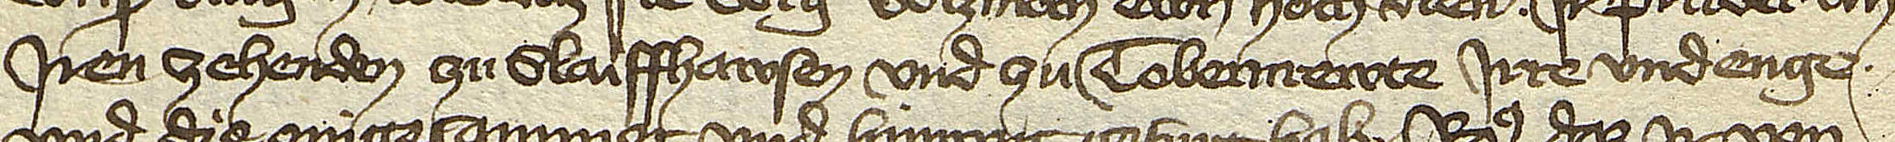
Iren cʒeheden cʒu Slaiffhawſen vnd on Tobenrewte Irre vnd enge . /
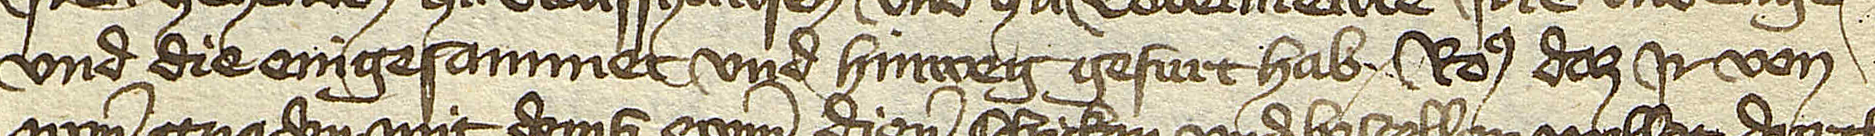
vnd die eingeſammet vnd hinweg gefurt hab . / Ro* daʒ Ir von
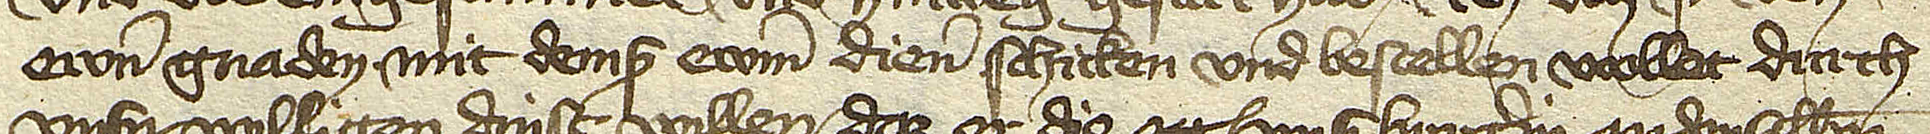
ewn* gnaden mit demſ* ewm* dien* ſchicken vnd beſtellen wollet durch
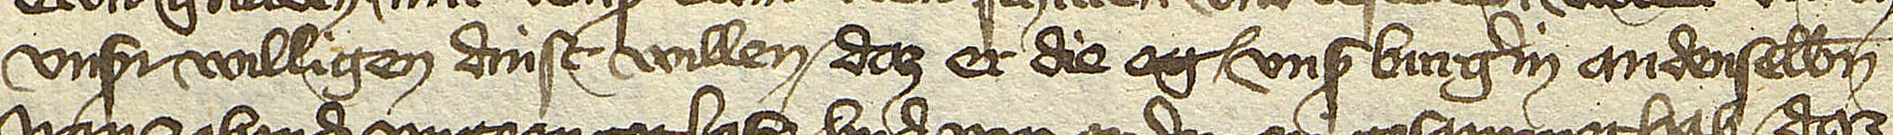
vnſ*r wolligen dinſt willen / daʒ er die eg* vnſ* burg*in an denſelbn*
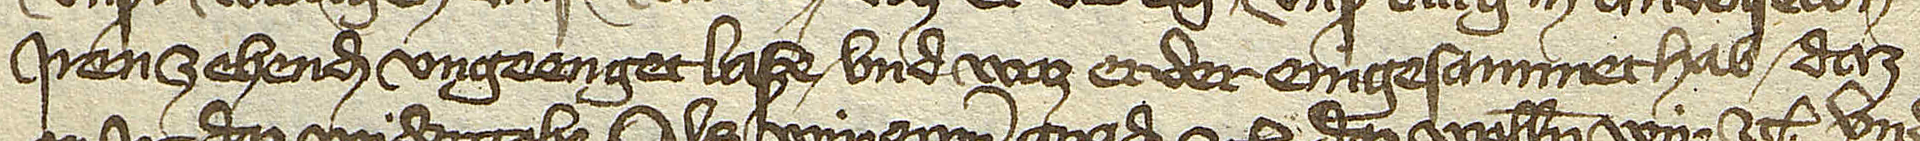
Iren cʒehend* vngeenget laſʒe / vnd waʒ er der eingeſammet hab / daʒ
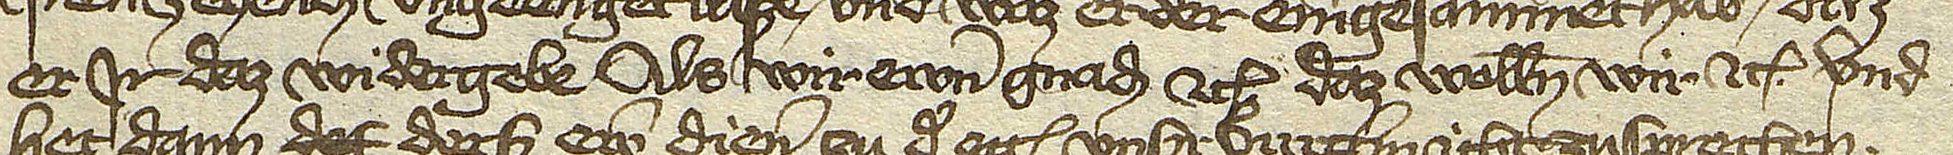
er Ir daʒ widergebe / Als wir ewn* gnad* ec* daʒ welln* wir ec* . vnd
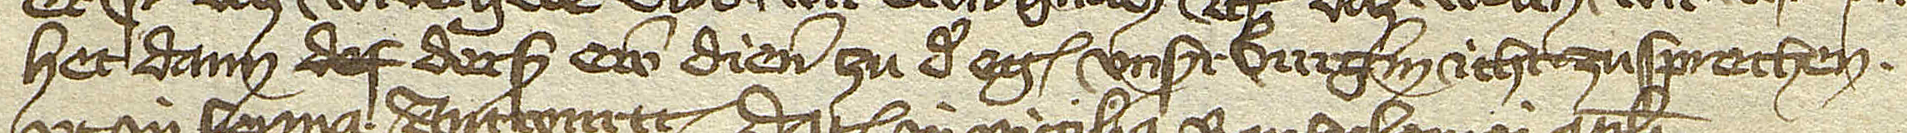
het dann deſ derſ* ew* dien* cʒu d* eg* vnſ*r burg*in icht cʒuſprechen .
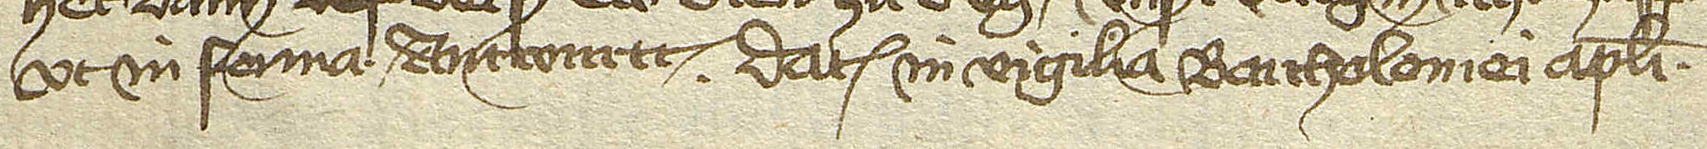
vt in forma / Antwurtt / . dat* in vigilia Bartholomei apli* .
